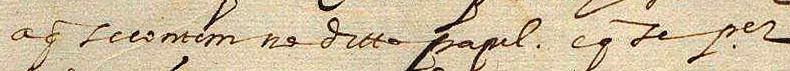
o q̄ se contem no ditto papel, e q̄ se per
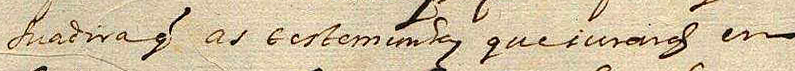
suadira q̄ as testemunhas que iuraraõ em
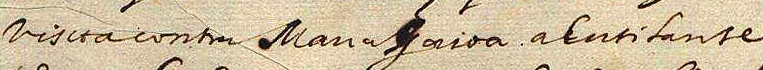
visita contra Maria Gorioa a Cutitante
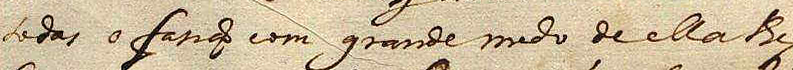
todas o fasiaõ com grande modo de ella lhes
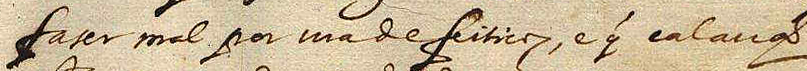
faser mal por uia de feitiços, e q̄ calauaõ
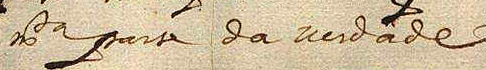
mta parte da uerdade
